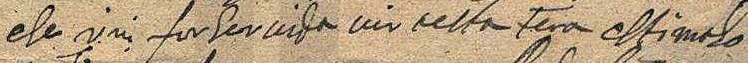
e se vm for seruida uir a esta tera estimalo
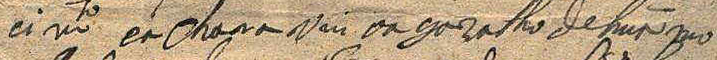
ei mto e aChara vm o agazalho de huā mo
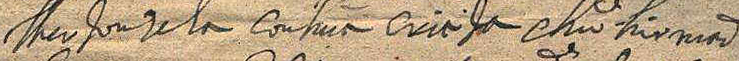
lher donzela con huā criada e hū hirmaõ
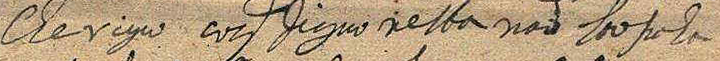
Cleriguo e o q̄ diguo nesta naõ sao pala
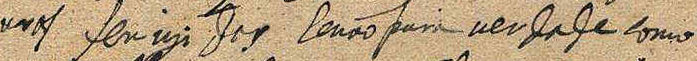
uras fenigidas senão pura uerdade como
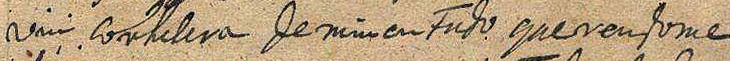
vm conhesera de mim en tudo querendome
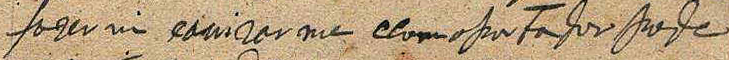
fazer m e auizarme e com o portador pode
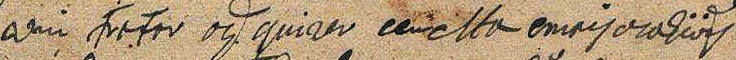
vm tratar o q̄ quizer e em esta e mais ocaziõis
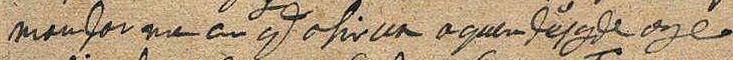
mandar me em q̄ a sirua a quem deos gde oge
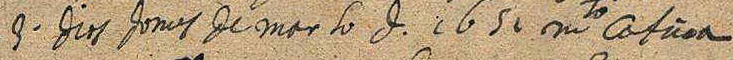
.3. dias do mes de marso de 1651 mto catiua
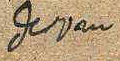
de vm
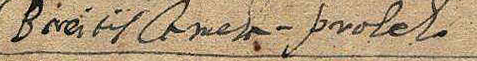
Bereitis Camela - prosel
